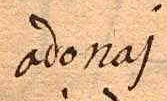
adonaj
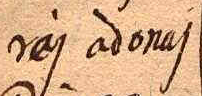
rej adonaj
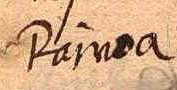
Rain_a
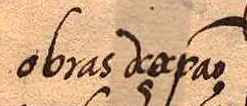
obras de xpão
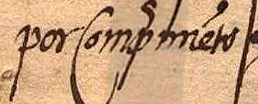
por Comp̄mēto
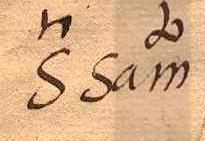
Sto Samto
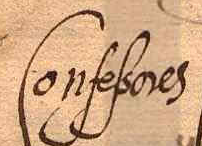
Confessores
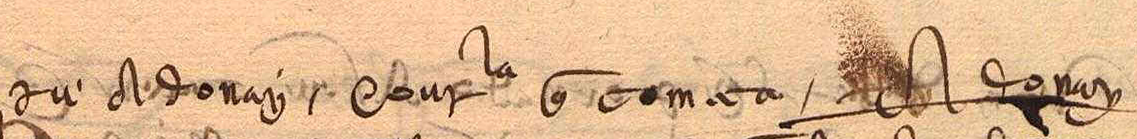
tu Adonay / e outra q̄ começa / Adonay
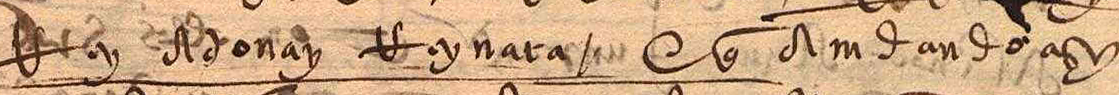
Rey Adonay Reynara / e q̄ Amdando asy
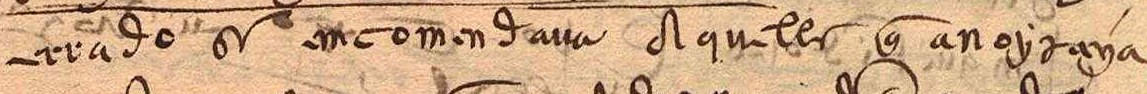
errado se emcomendaua Aquelle q̄ anoytecya
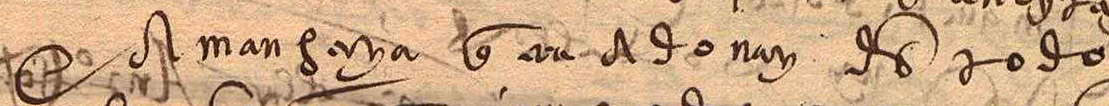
e Amanhecya q̄ era Adonay ds̄ todo
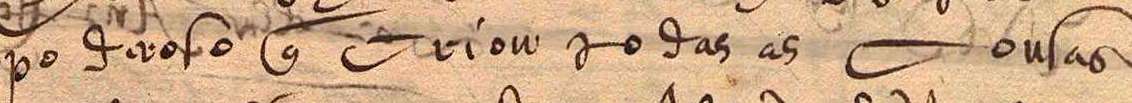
poderoso q̄ Criou todas as Cousas
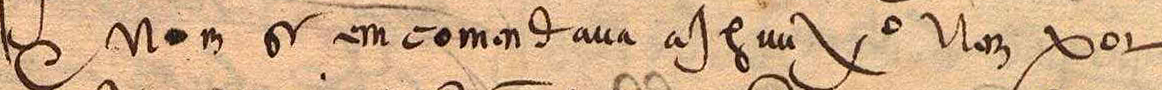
e nom se emcomendaua a Jhuū Xo Nem por
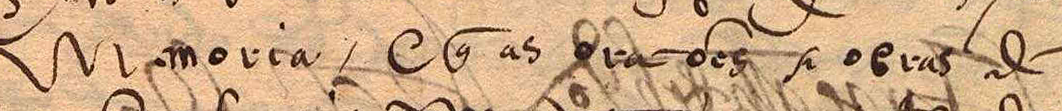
Memoria / e q̄ as oraçoẽs e obras de
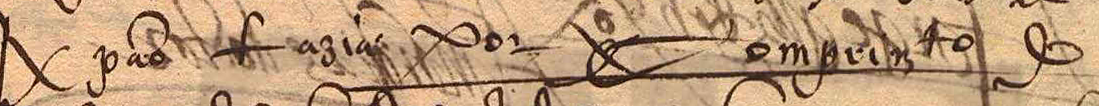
Xpaõ fazia por Comprimto do
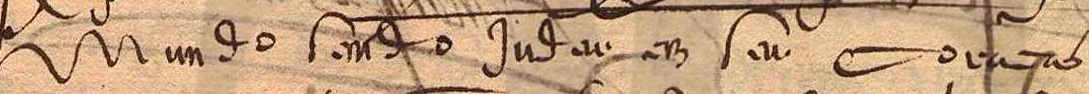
Mundo semdo Judeu em seu Coraçaõ
